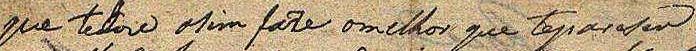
que te dou asim faze o melhor que te pareser
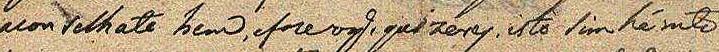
aconselhate bem, e faze o q̄ quizeres, isto sim hé mto
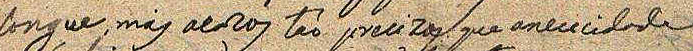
longue, mas acazos taó precizos que a nececidade
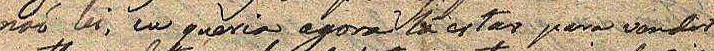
naó lei, eu queria agora lá estar para vender
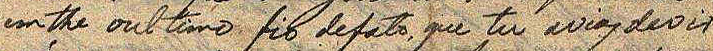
em the o ultimo fio de fato, que tu avias de vir
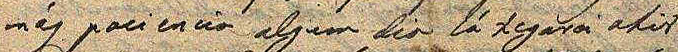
más paciencia algum dia lá xegarei a hir
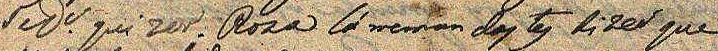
se D.s quizer. Rosa lá memandastes dizer que
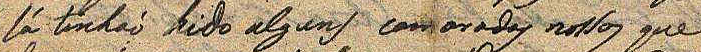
lá tenhaó hido alguns camaradas nossos que
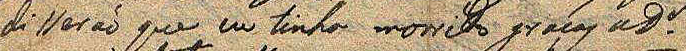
disseraó que eu tinha morrido graças a D.s
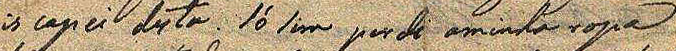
iscapei desta. Só sim perdi a minha ropa
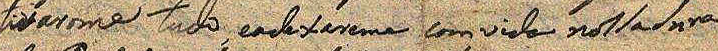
tirarome tudo e adexareme com vida nossa Snra
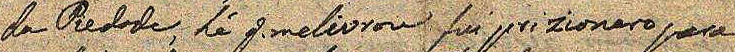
da Piedade, hé q̄ me livrou fui prizionero para
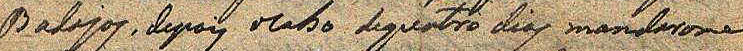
Badajos, depois o cabo de quatro dias mandarome
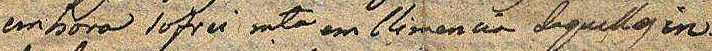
embora sofrei mta emClimencia daquellas in
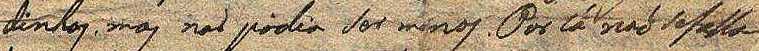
dinhos. mas não podia ser menos. Por cá naõ se falla
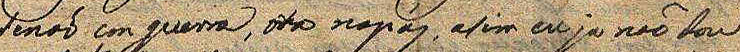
senaõ em guerra, ora ropás, asim eu ja naõ dou
